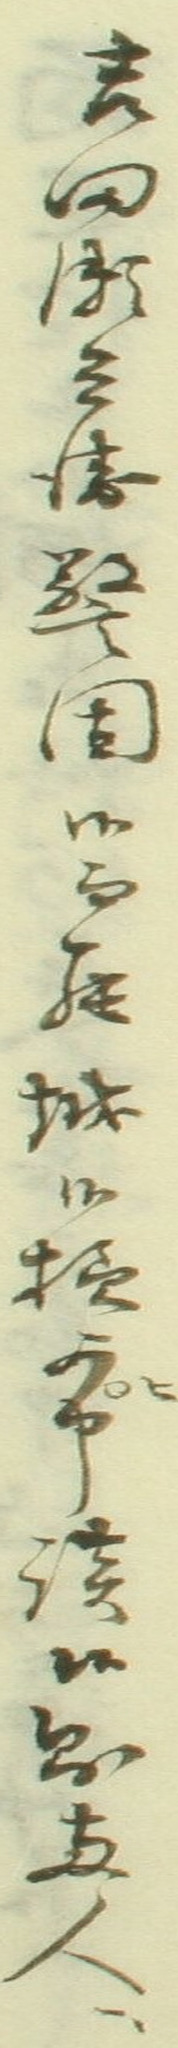吉田瀬兵衛警固候而罷越候様可◦申談候則両人へ
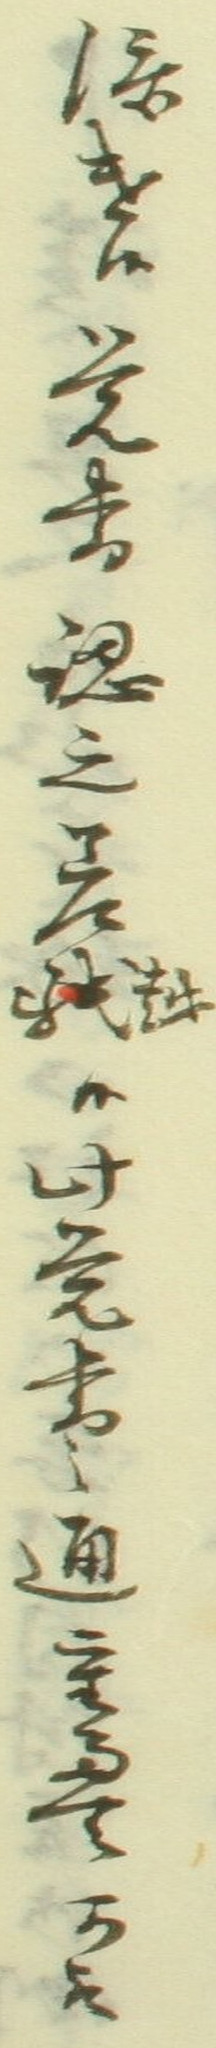渡遣候覚書認之差越候此覚書之通重畳可被

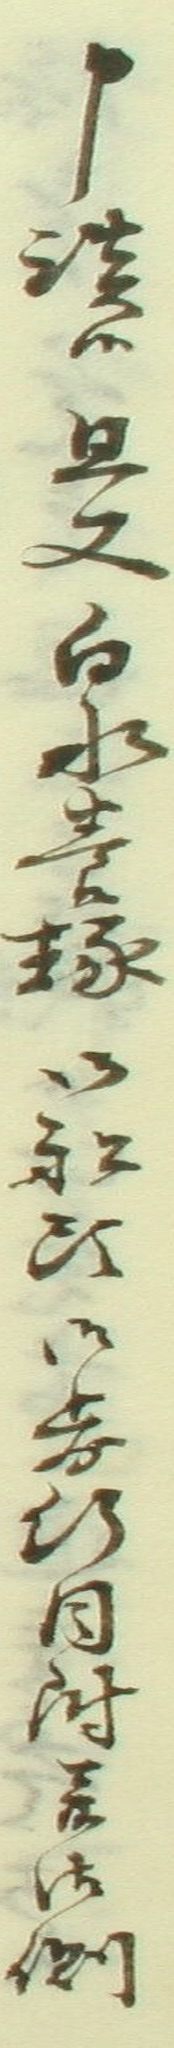申談候且又白水養琢御船頭御歩行目付并御側
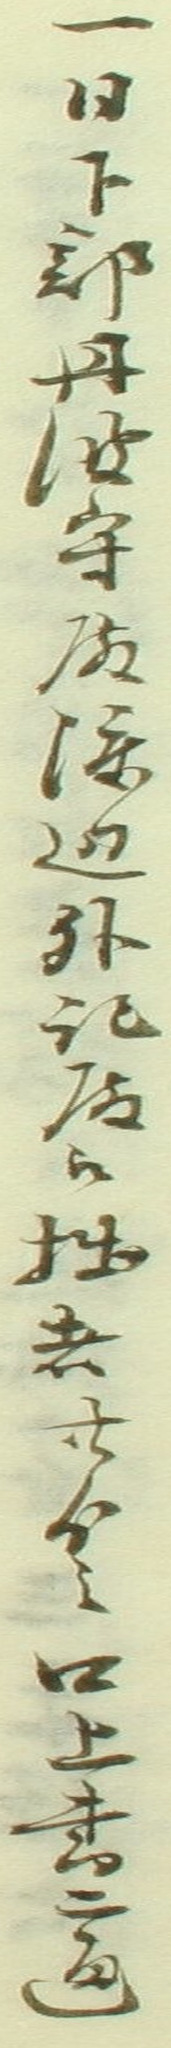一日下部丹波守殿渡辺外記殿え拙者共ゟ之口上書二通
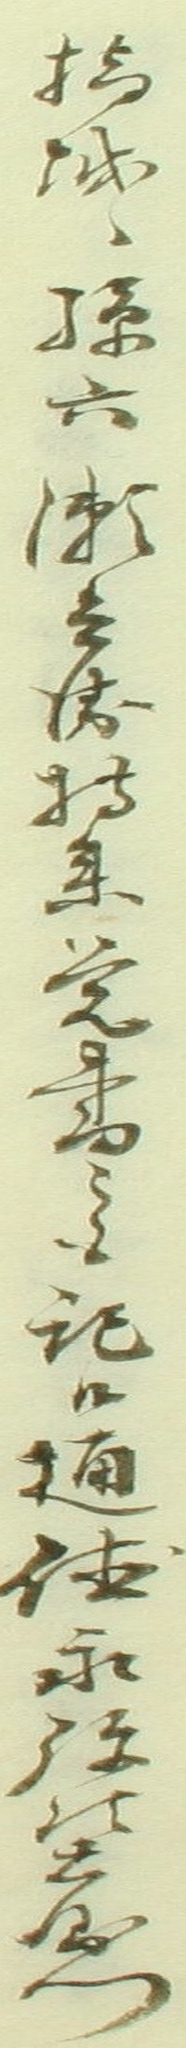指越候孫六瀬兵衛持参覚書にも記候通徳永弥次右衛門
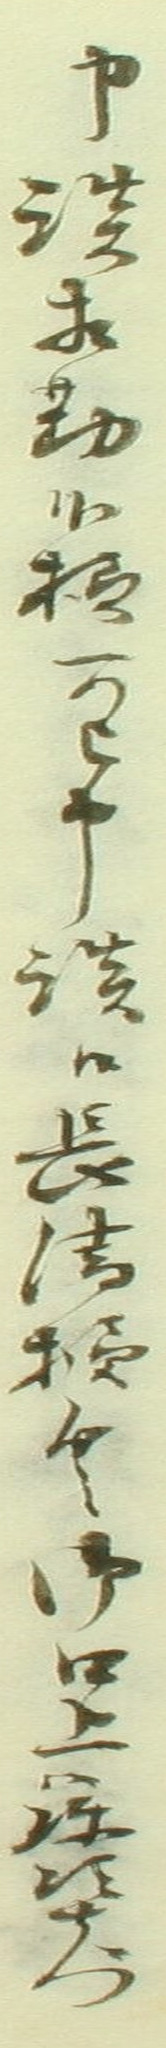申談相勤候様可被申談候長清様ゟ之御口上は弥次右衛門
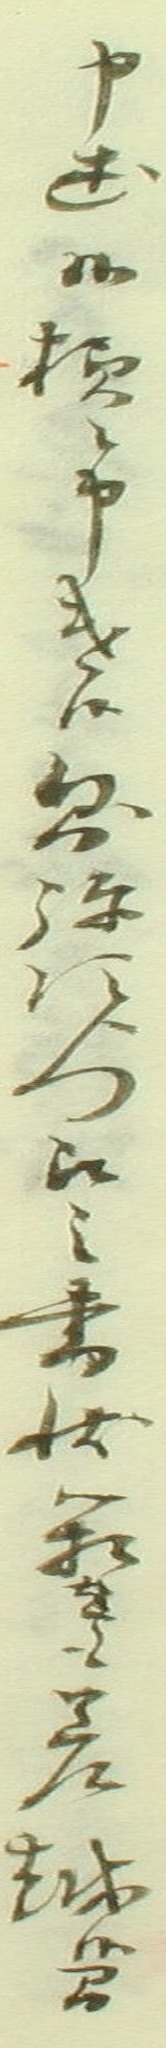申述候様被申遣候則弥次右衛門え之書状箱をも差越候間
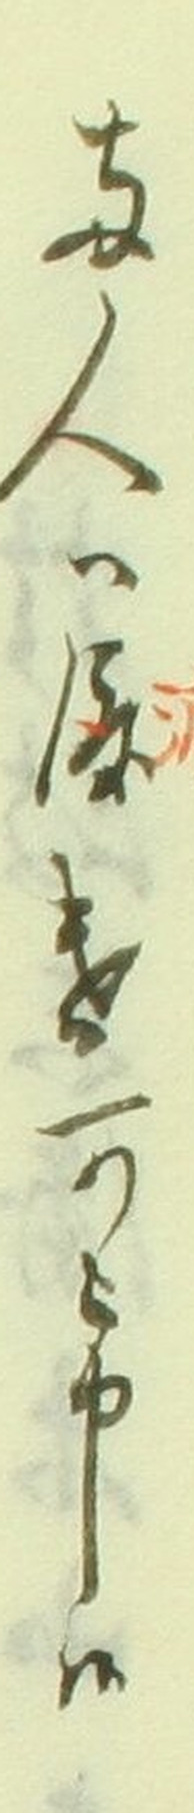両人へ渡遣可被申候
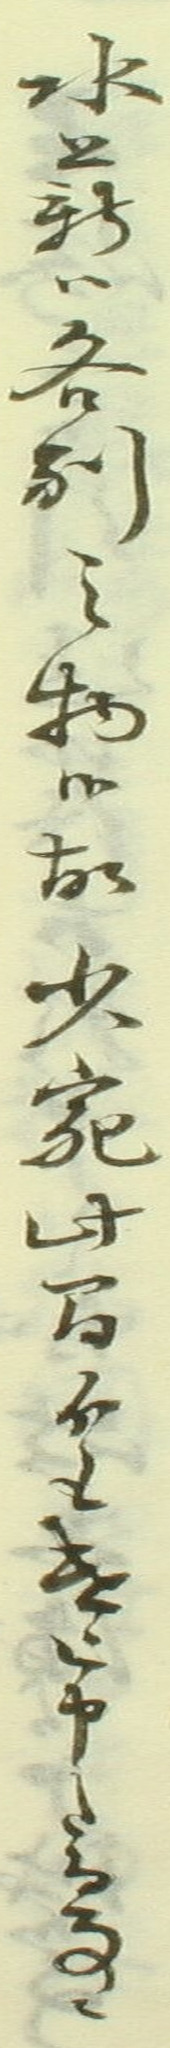水薪は各別之物候故少宛此間ゟも遣被申たる事に
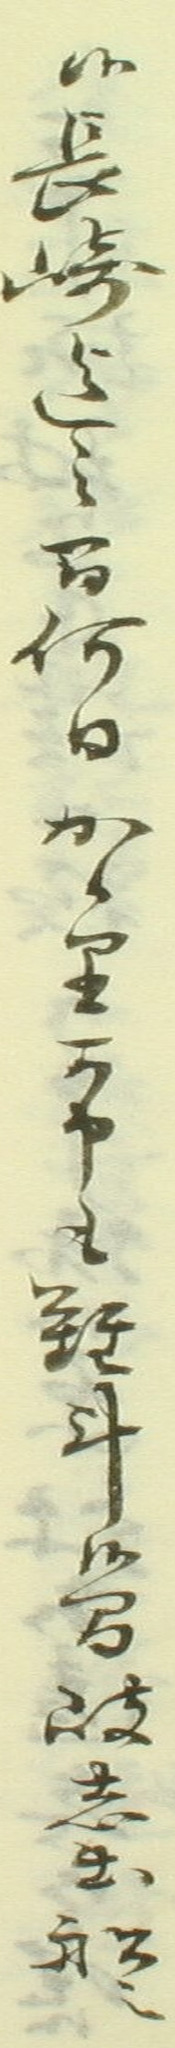候長崎迄之間何日かゝり可申も難計候間岐志出船之
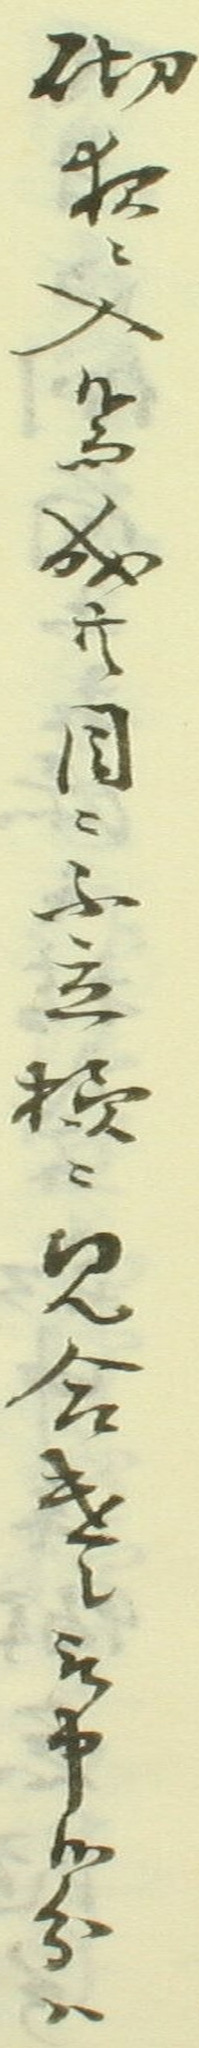砌夜に入候而成共目に不立様に見合遣し被申候分は
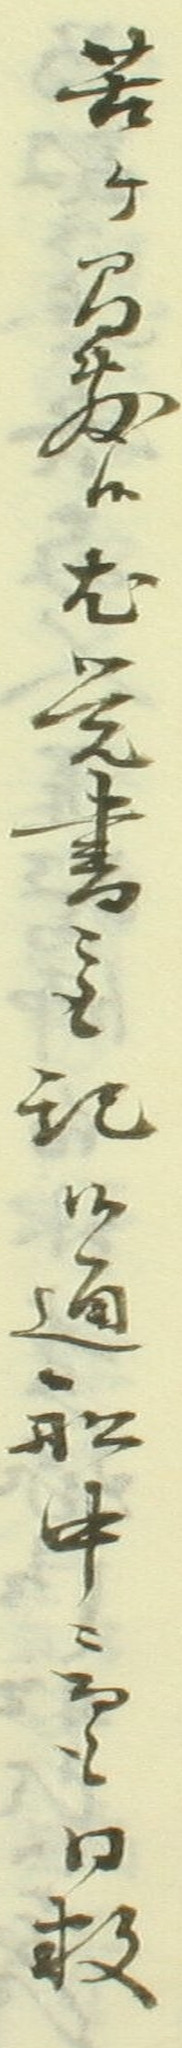苦ヶ間敷候尤覚書にも記候通船中に而も日数
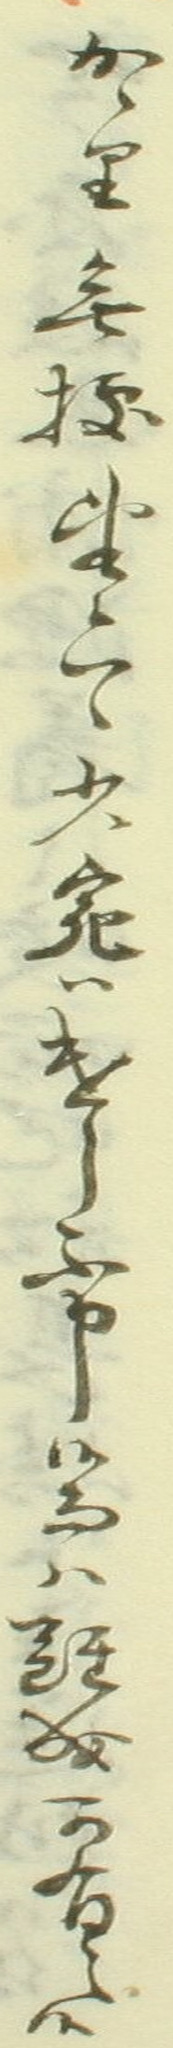かかり無拠望候はゝ少宛は遣し不申候而は難成可有之候
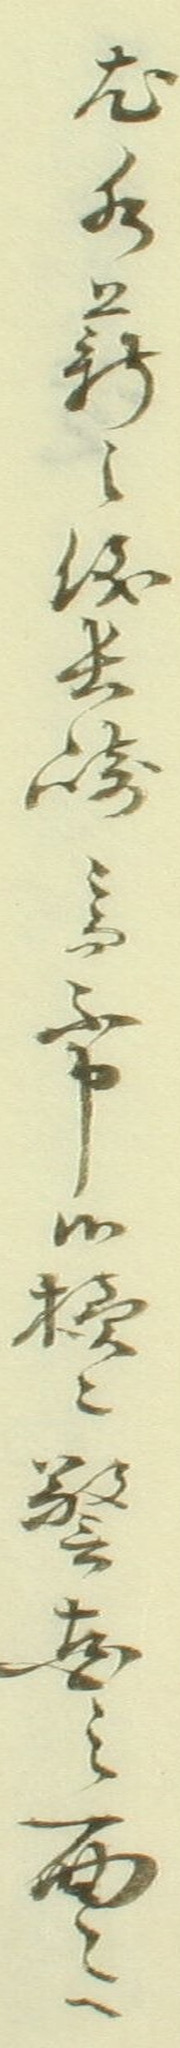尤水薪之儀長崎に而不申候様に警固之面々へ
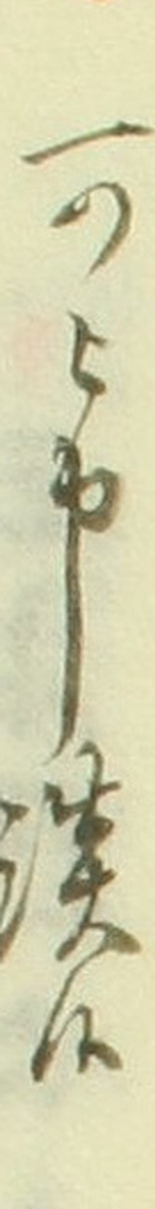可被申談候
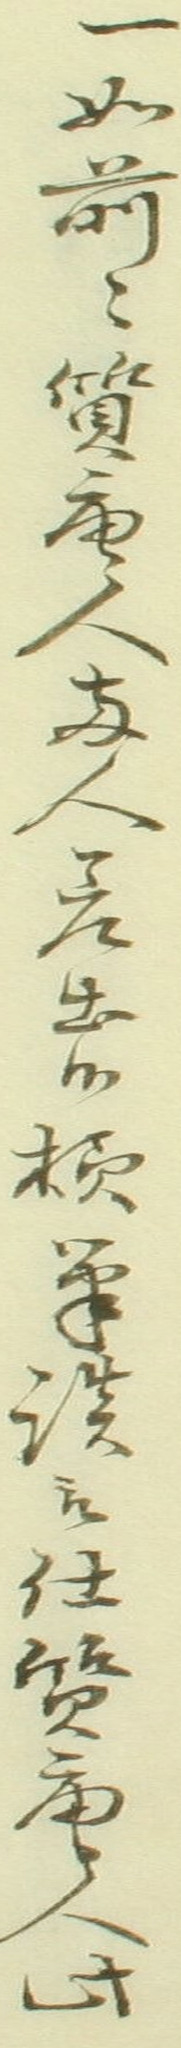一如前々質唐人両人差出候様筆談被仕質唐人此
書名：異国船漂着記
